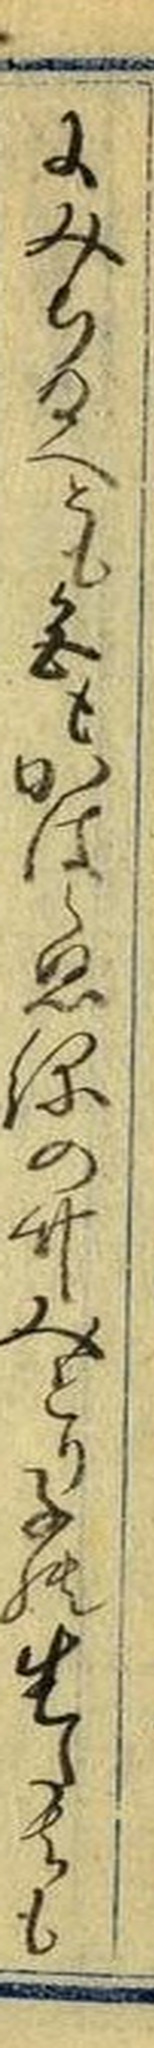にみちるへとも色もかはらぬ緑の竹みとり子の生たちも
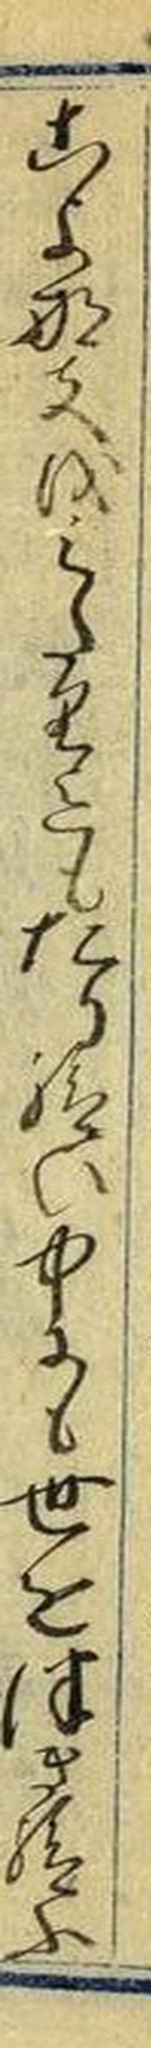こよなきをみたり迄もたり給ひ中にも世をつき給ふ
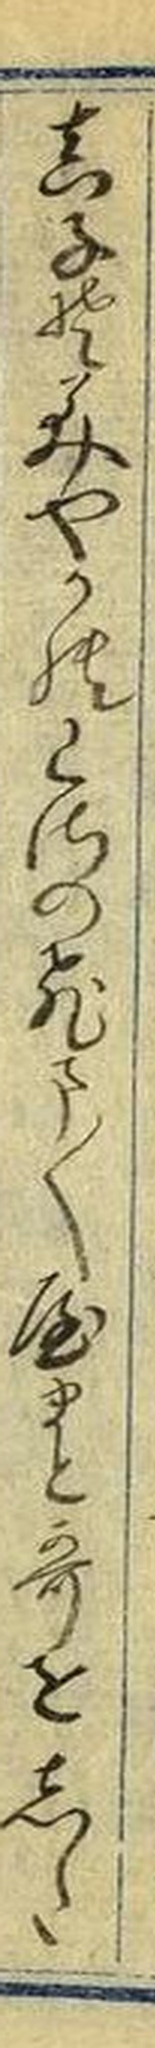まねそみやかのわさのひま〳〵やまと哥をした
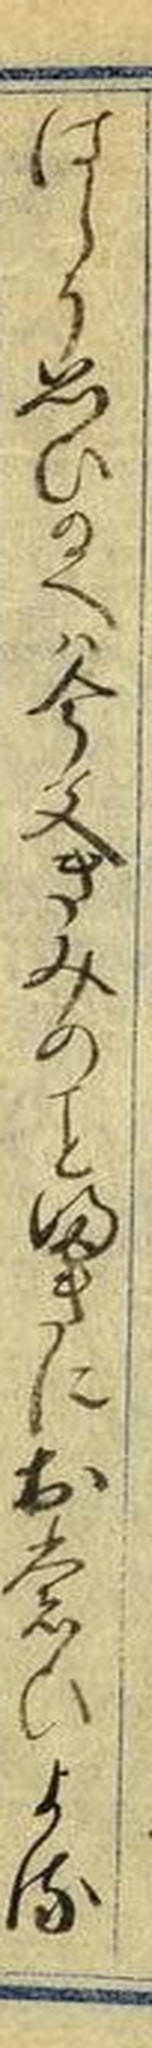はしう思ひ給へ今父きみのことふきにおもひよる
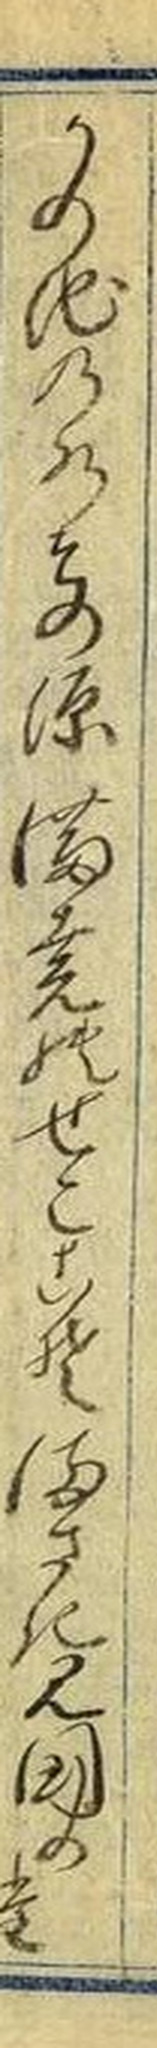かの池の水その源満尭のせここそまさき見国のた
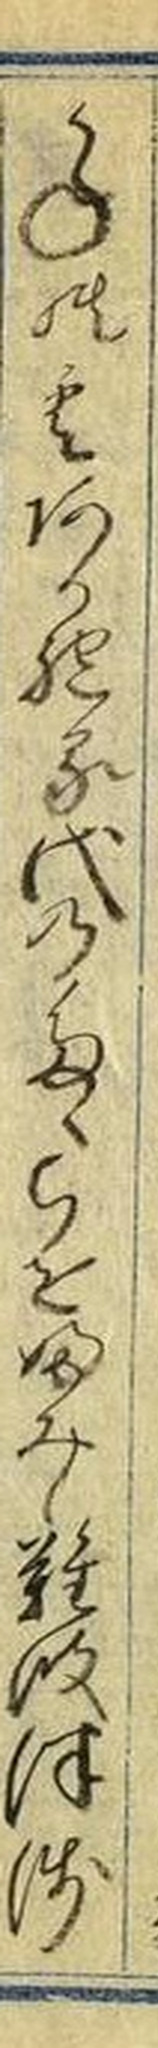かねの空あかける代のたゝらをふみし難波津浅
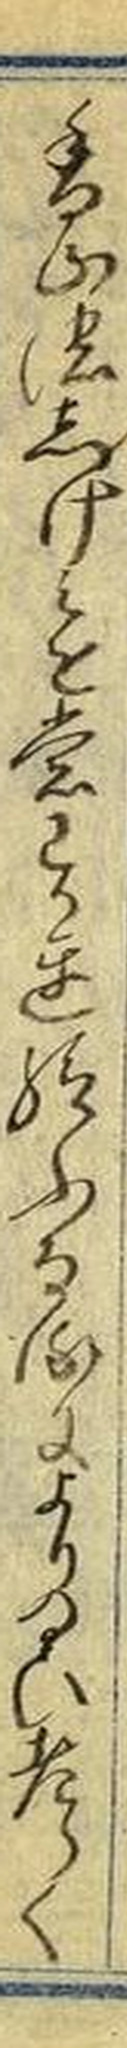かる心のしけみをもわかれ給ふる侍により給ひ老らく
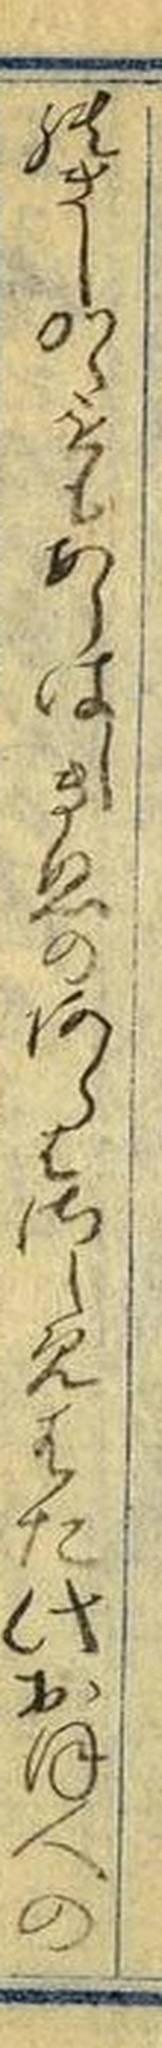のきしかたをもあらはしきぬのあらはさしめはた此おほ人の

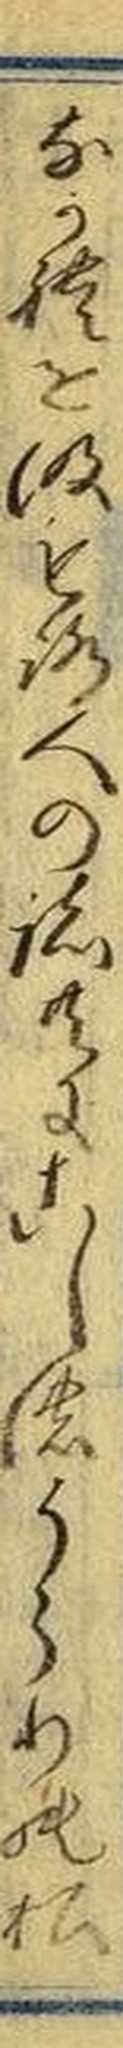なかれを波もろ人の諸共にこしのうらわの松
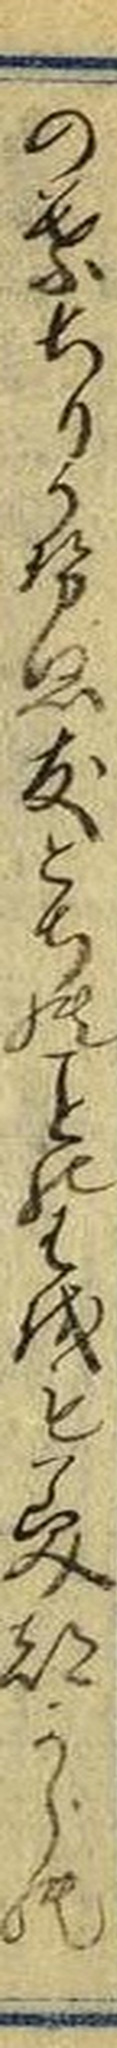の葉ちりうせぬ共とちのことのはをもみつからの
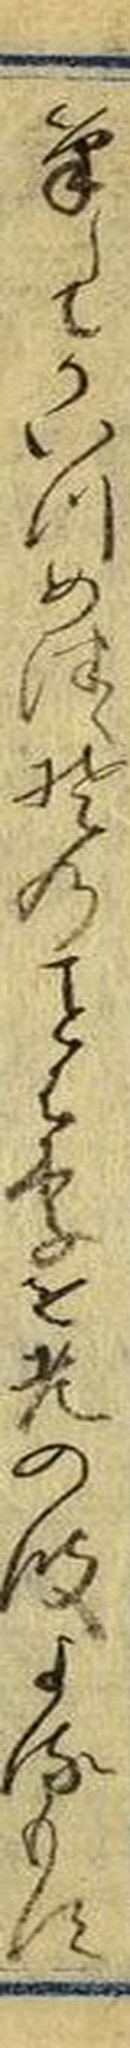筆してかいつめつゝそのことはりを老の波よるもす
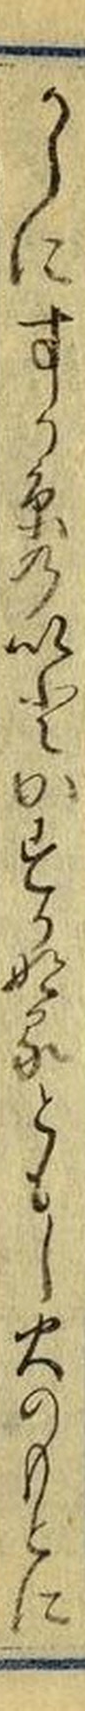からにすか原のいとかすかなるともし火のもとに
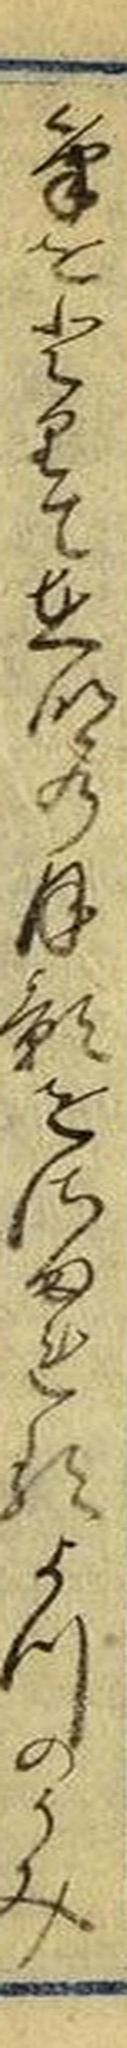筆をとりて在明の月影をさまれるよつのうみ
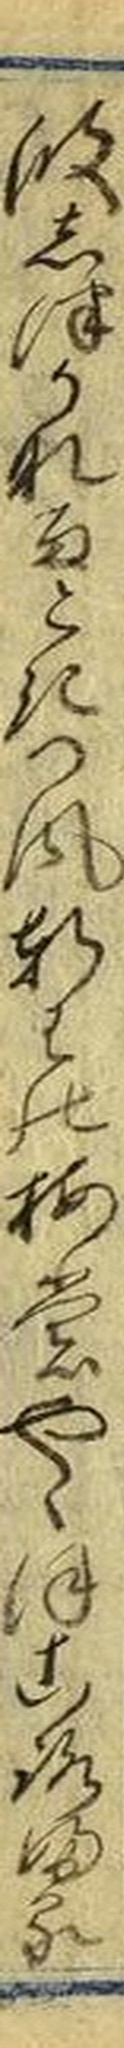波しつかなるときつ風軒はの梅もやゝほころひる
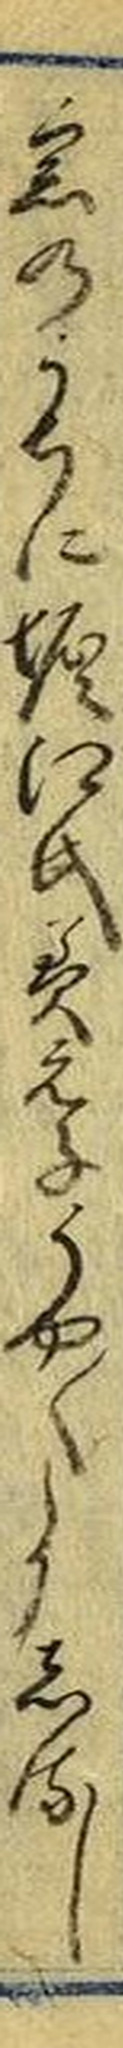空のうちに堀江氏みえ子うや〳〵しうしるし
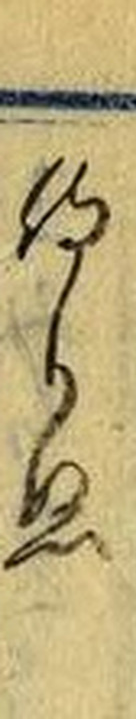侍りぬ
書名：温古集 三巻
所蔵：福井県文書館 Fukui Prefectural Archives
